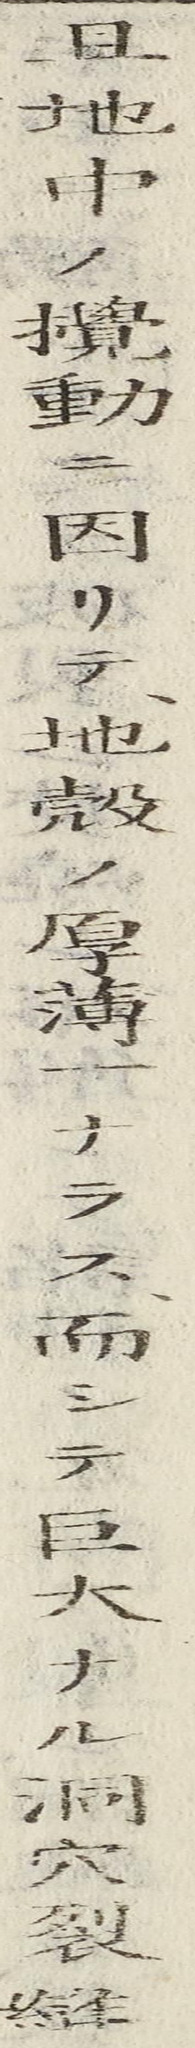且地中ノ撹動ニ因リテ、地殻ノ厚薄一ナラス、而シテ巨大ナル洞穴裂縫
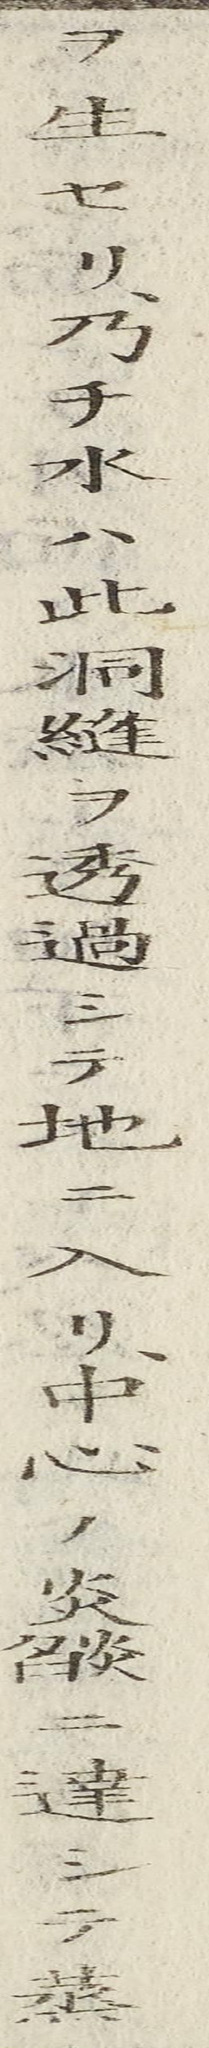ヲ生セリ、乃チ水ハ此洞縫ヲ透過シテ地ニ入リ、中心ノ炎燄ニ達シテ蒸
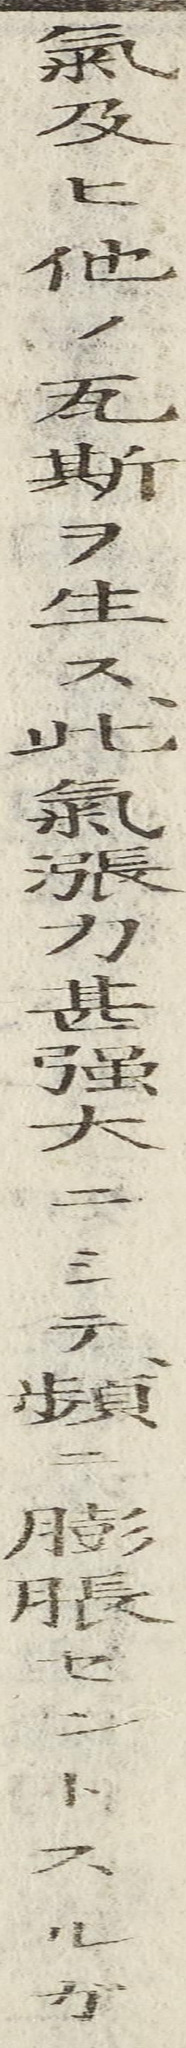気及ヒ他ノ瓦斯ヲ生ス、此気漲力強大ニシテ、頻ニ膨張セントスルガ
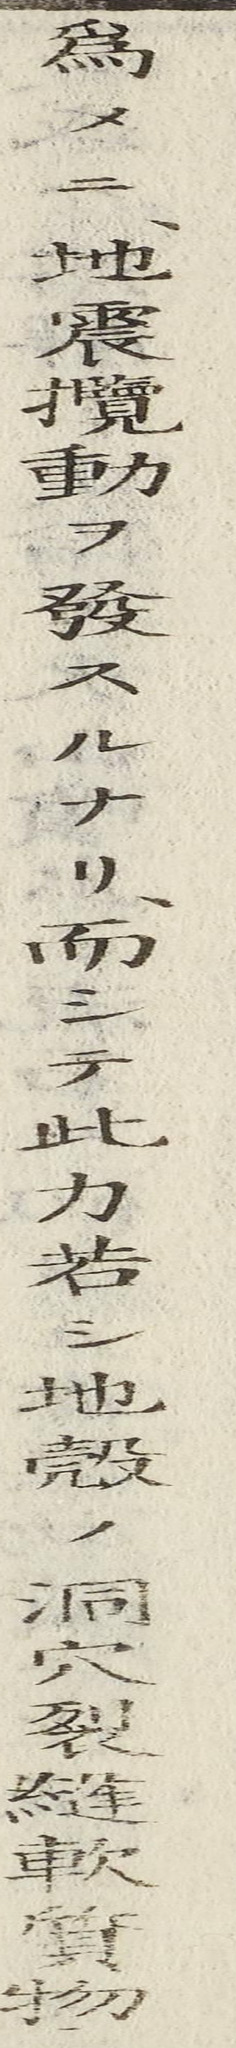為メニ、地震撹動ヲ発スルナリ、而シテ此力若シ地殻ノ洞穴裂縫軟質物
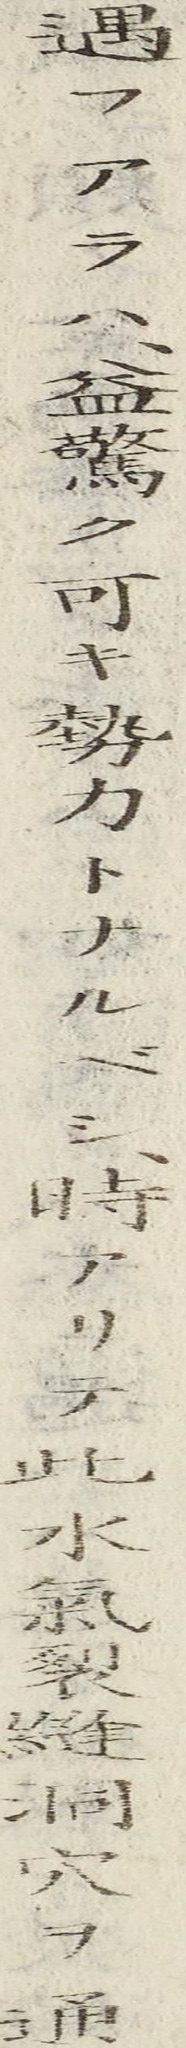遇フアラハ、益驚ク可キ勢力トナルベシ、時アリテ此水気裂縫洞穴ヲ通
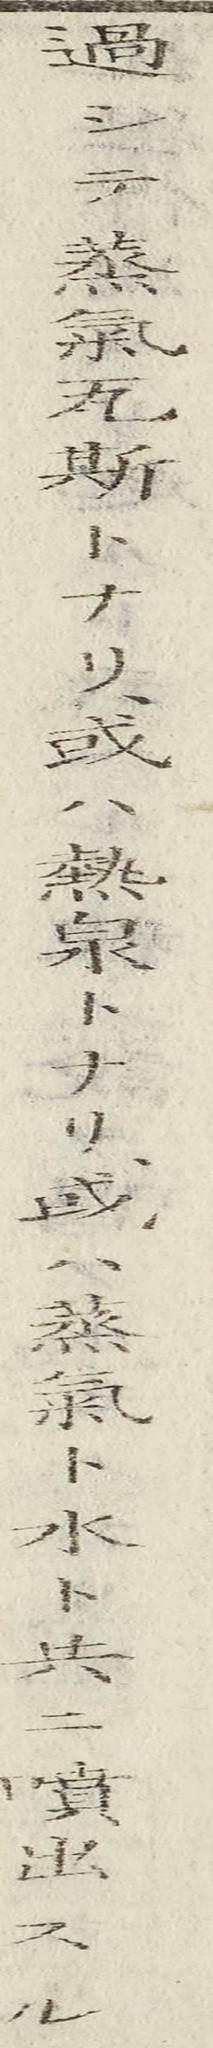過シテ蒸気瓦斯トナリ、或ハ熱泉トナリ、或ハ蒸気ト水ト共ニ噴出スル
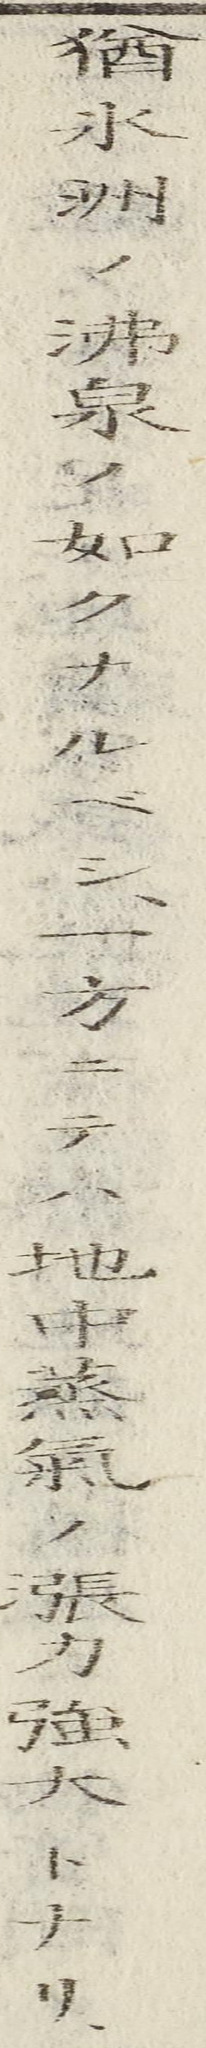猶氷洲ノ沸泉ノ如クナルベシ、一方ニテハ地中蒸気ノ漲力強大トナリ、
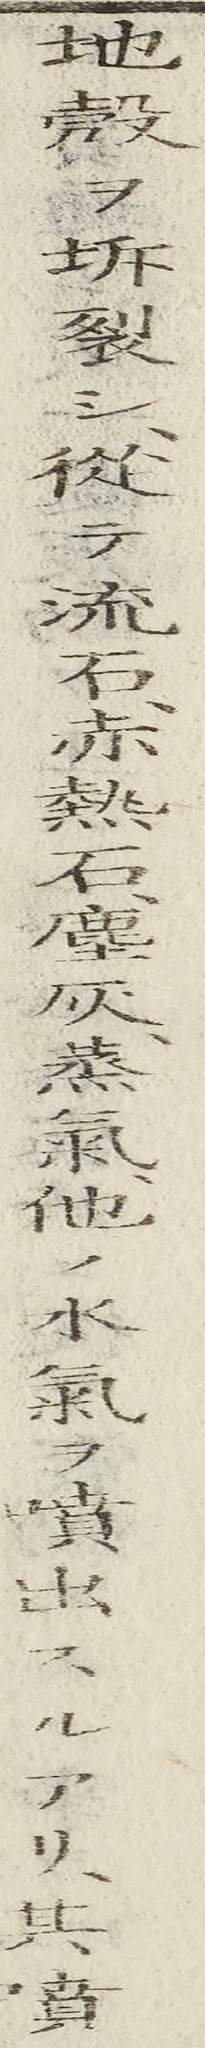地殻ヲ坼裂シ、従テ流石、赤熱石、塵灰、蒸気、他ノ水気ヲ噴出スルアリ、其噴
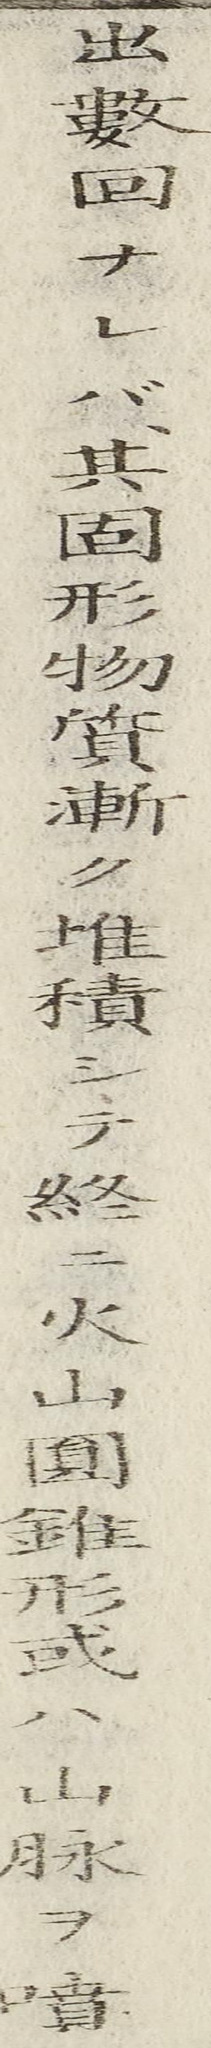出数回ナレバ、其固形物質漸ク堆積シテ終ニ火山円錐形或ハ山脉ヲ噴
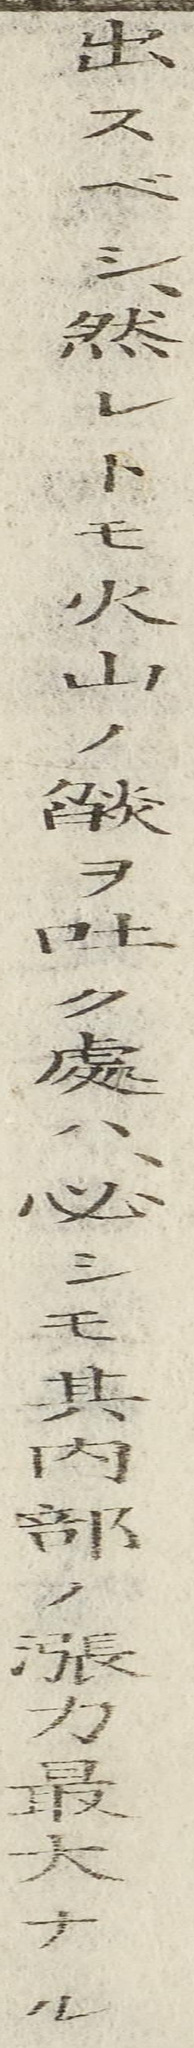出スベシ、然レトモ火山ノ燄ヲ吐ク処ハ、必シモ其内部ノ漲力最大ナル
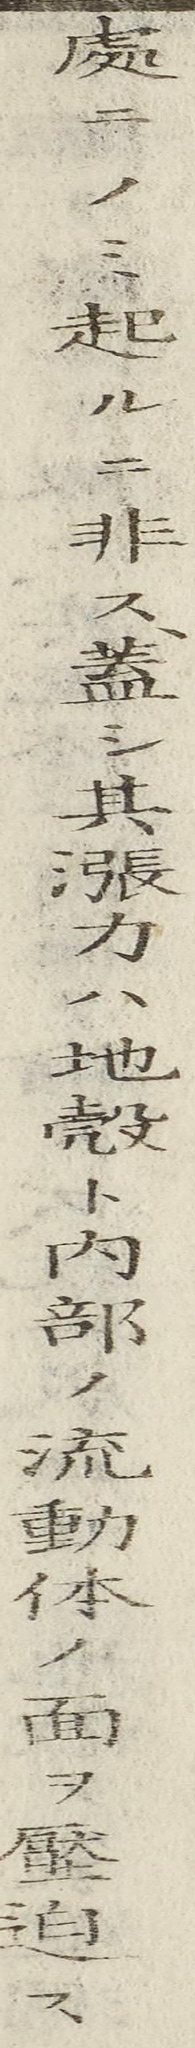処ニノミ起ルニ非ス、蓋シ其漲力ハ地殻ト内部ノ流動体ノ面ヲ圧迫ス

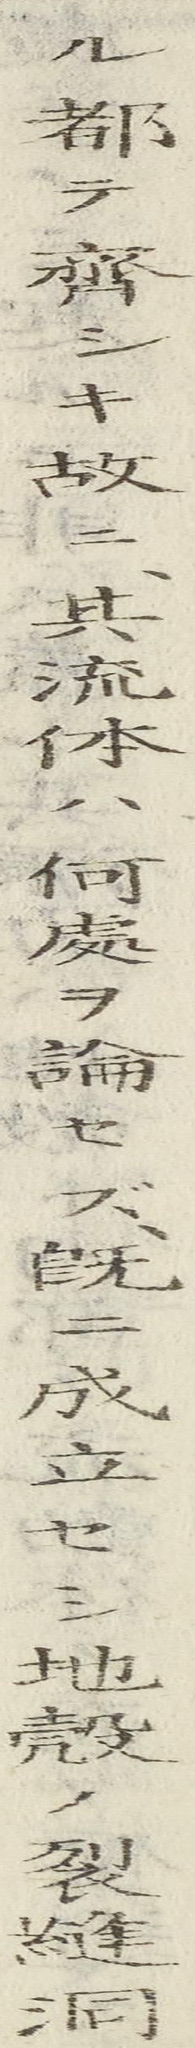ル都テ斉シキ故ニ、其流体ハ何処ヲ論セズ、既ニ成立セシ地殻ノ裂縫洞
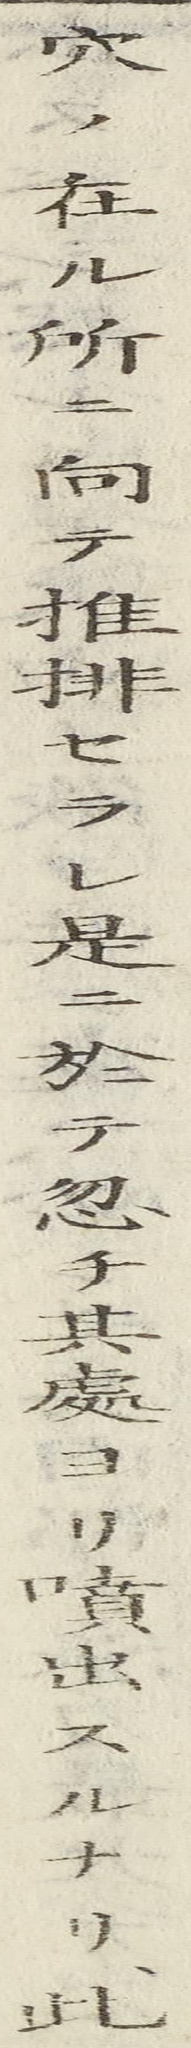穴ノ在ル所ニ向テ推排セラレ是ニ於テ忽チ其処ヨリ噴出スルナリ、此
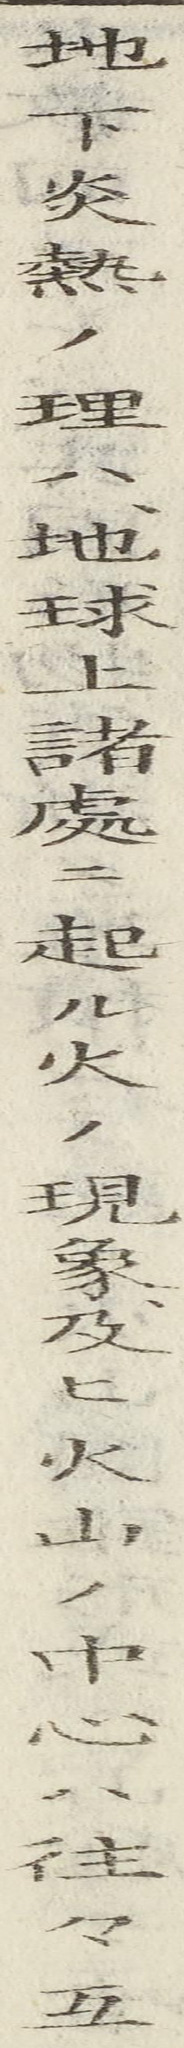地下炎熱ノ理ハ、地球上諸処ニ起ル火ノ現象、及ヒ火山ノ中心ハ往々互
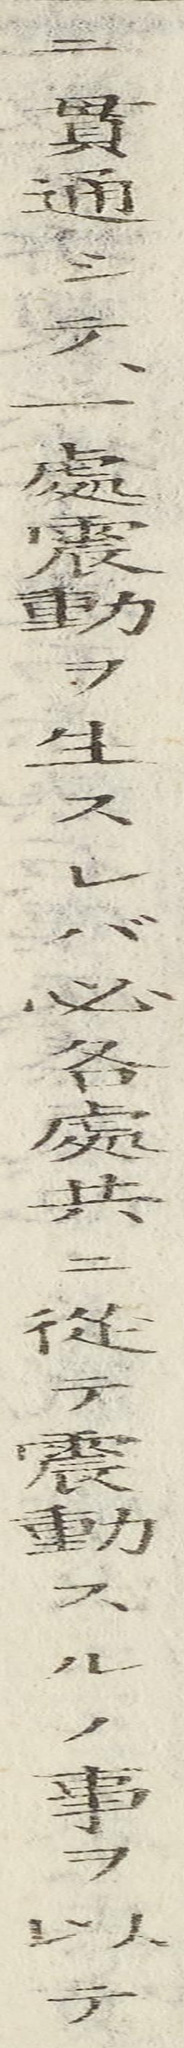ニ貫通シテ、一処震動ヲ生スレバ必各処共ニ従テ震動スルノ事ヲ以テ
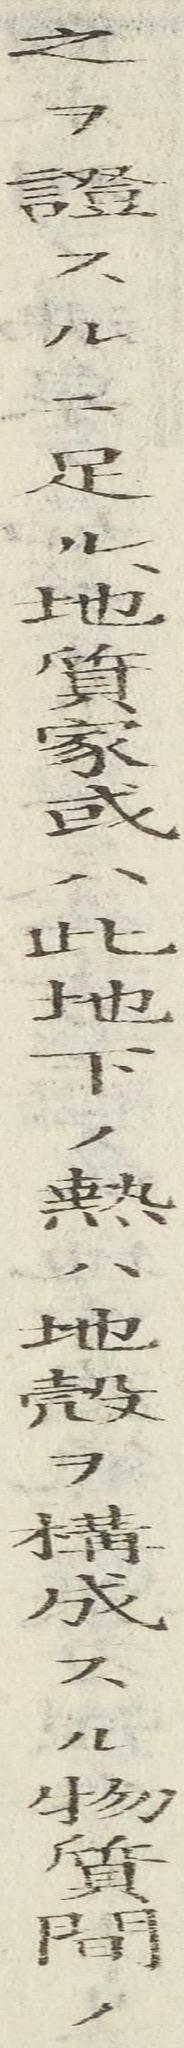之ヲ証スルニ足ル、地質家或ハ此地下ノ熱ハ地殻ヲ構成スル物質間ノ
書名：百科全書　地文學　全
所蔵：東京大学地震研究所図書室 Earthquake Research Institute Library, The University of Tokyo, JAPAN
